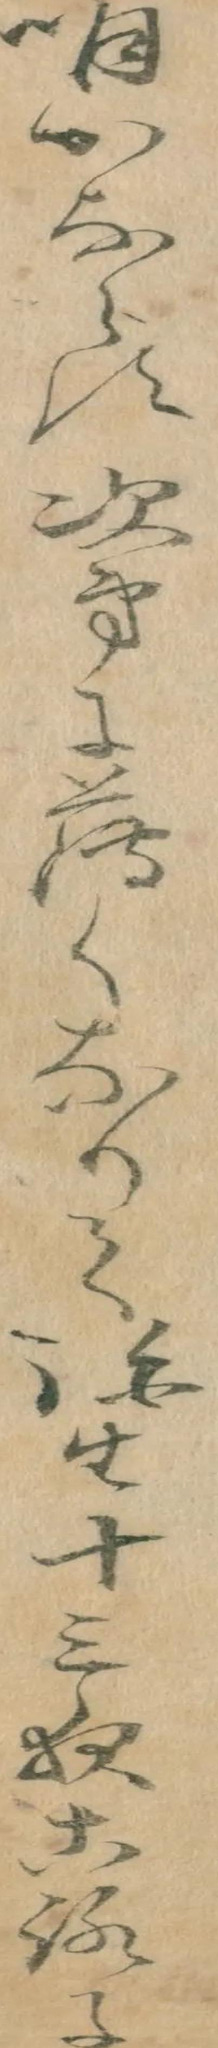明かならす次第に薄くなりて弥生十三夜ころに
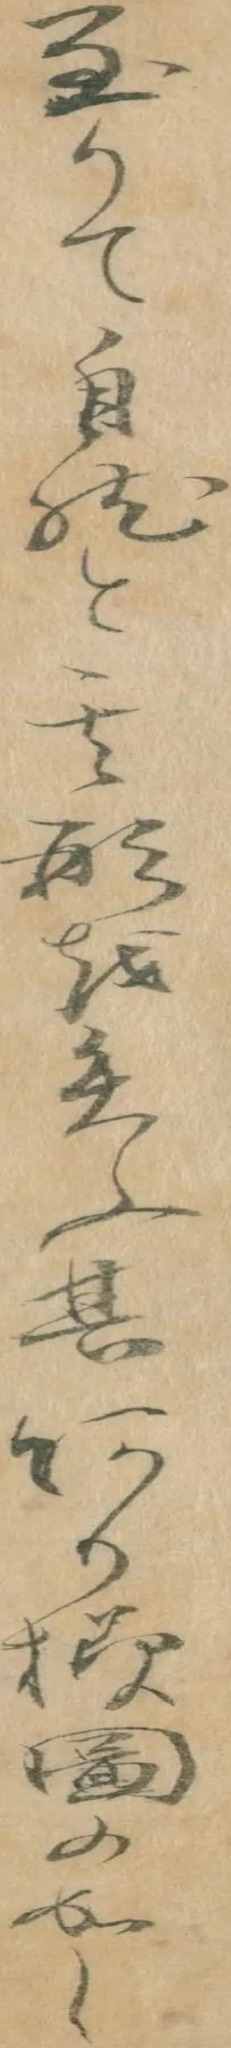至りて自然と其形を失ふ其あり様圖の如し

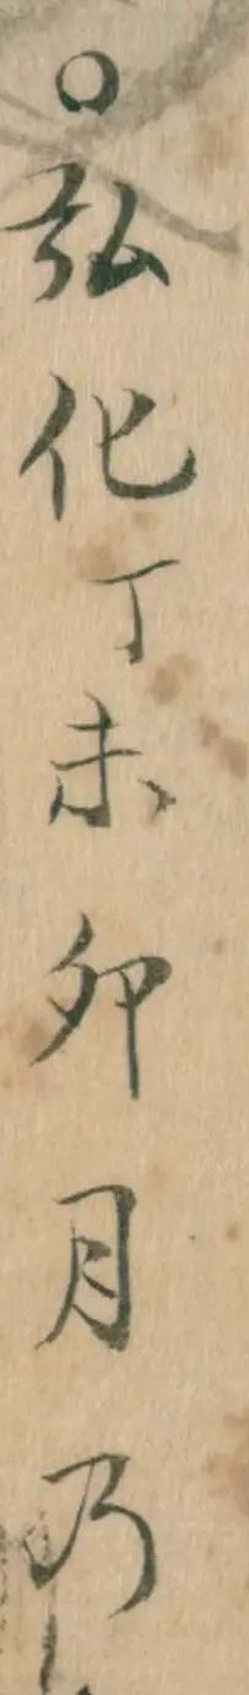○弘化丁未卯月の
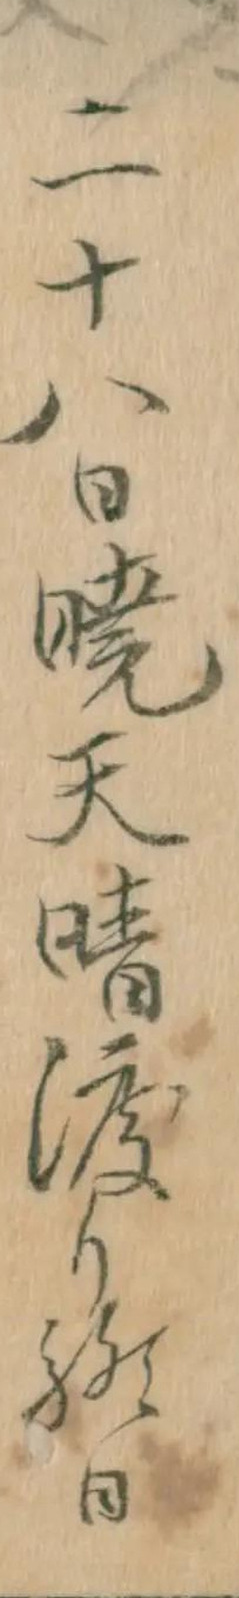二十八日暁天晴渡り終日
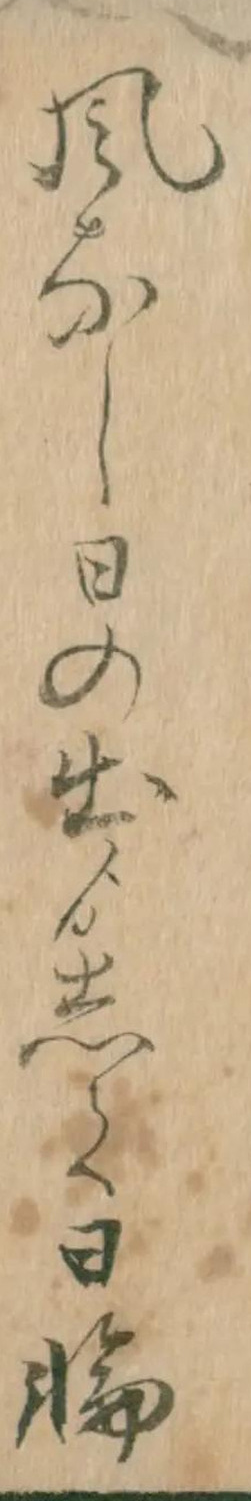風なし日の出ゟして日輪
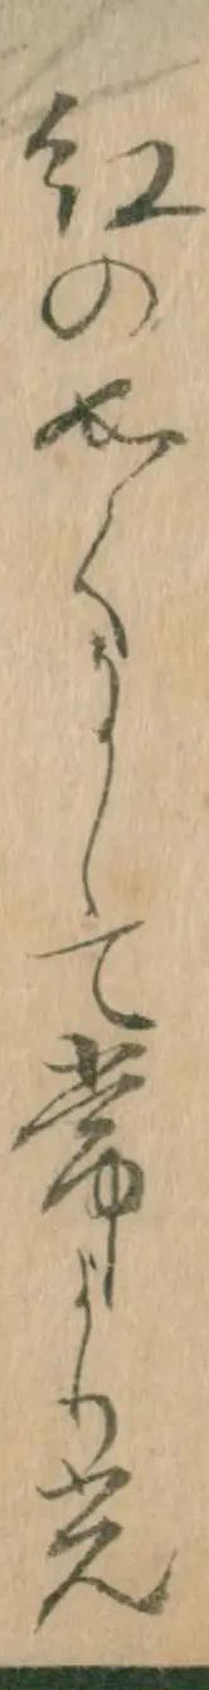紅の如くにして常より光
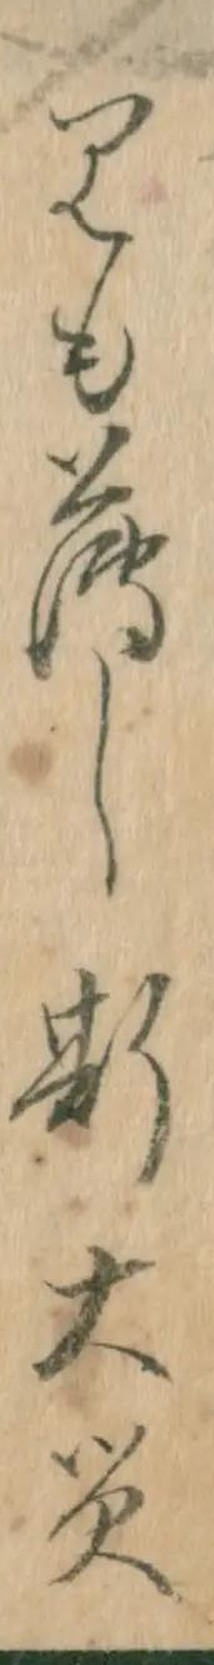りも薄し斯大災
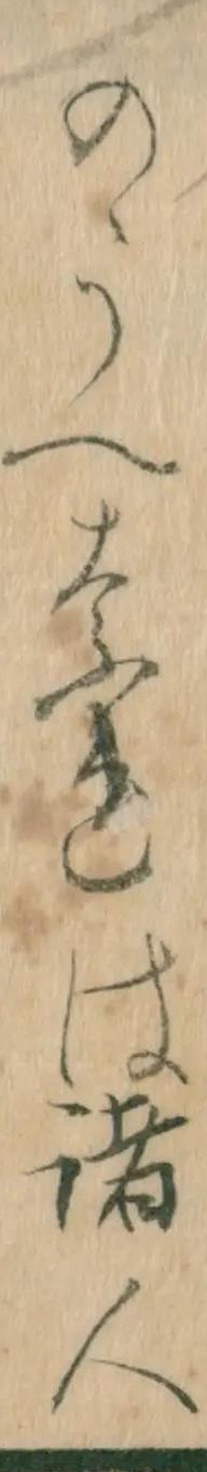のうへなれは諸人
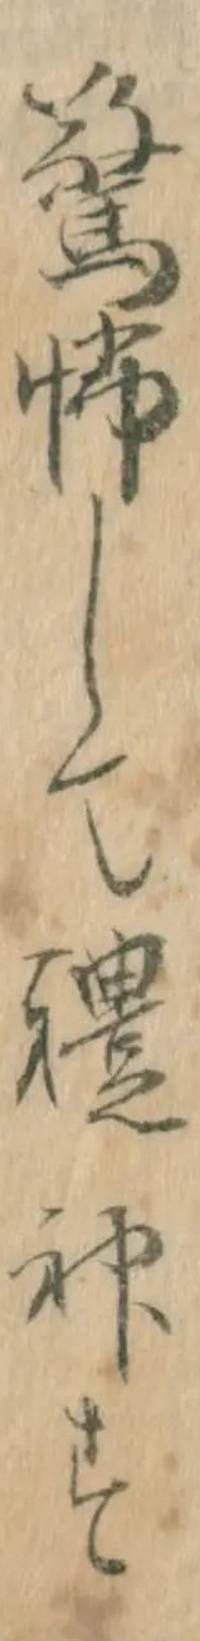驚怖して禮神す
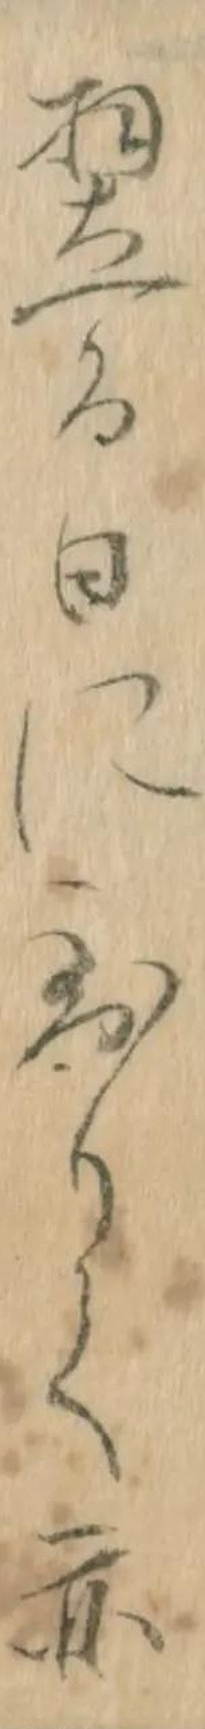翌る日に至りて亦
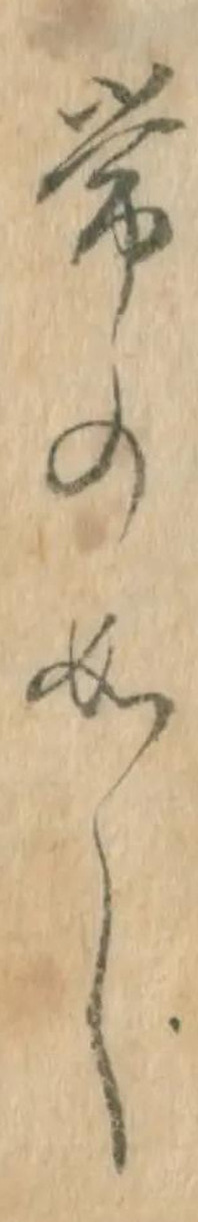常の如し

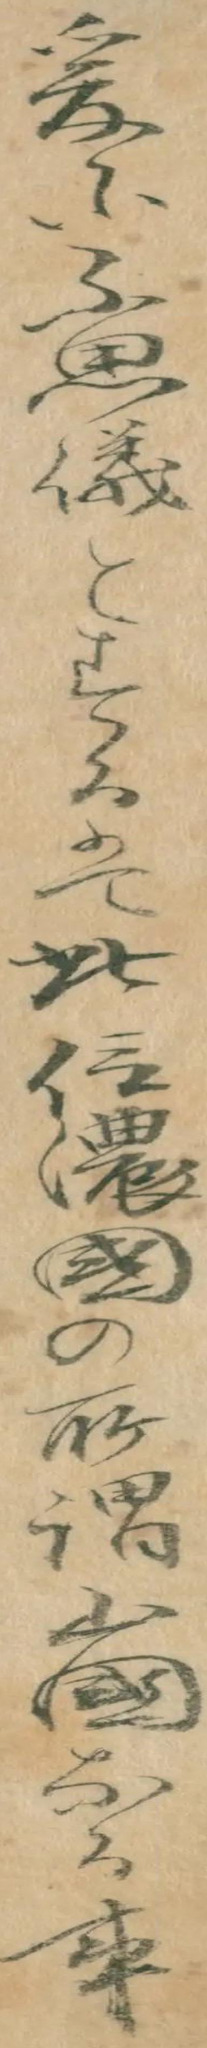爰に不思議とするは此信濃國の所謂山國なる事
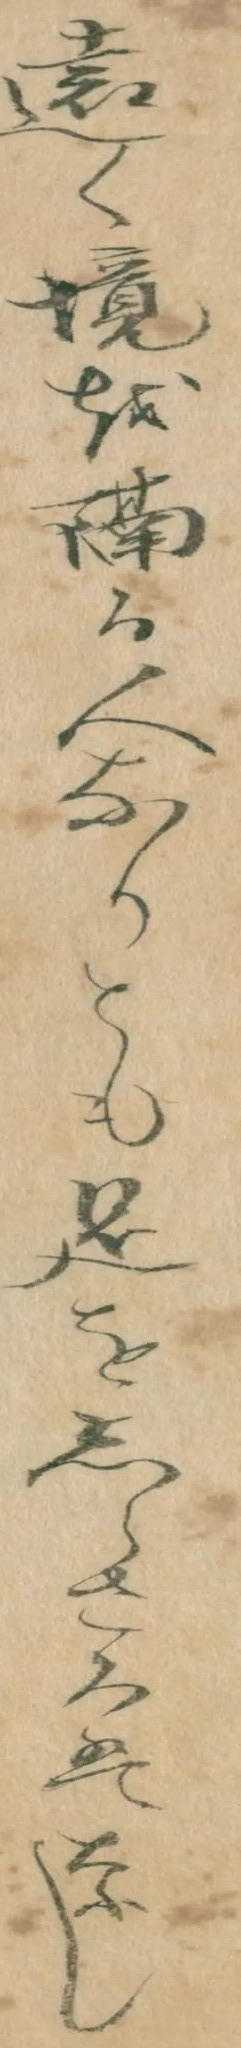遠く境を隔る人なりとも是をしらさるはなし
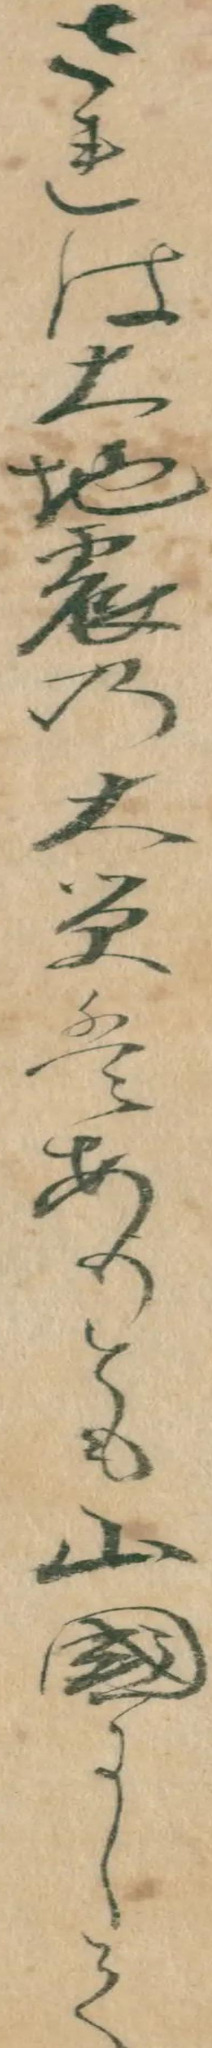されは大地震の大災はありとも山國にして
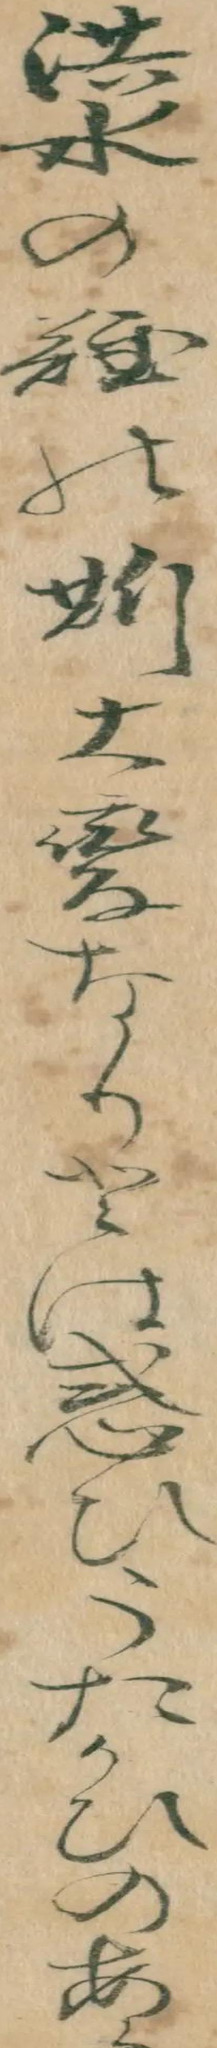洪水の難の斯大變なりとは惑ひうたかひのある
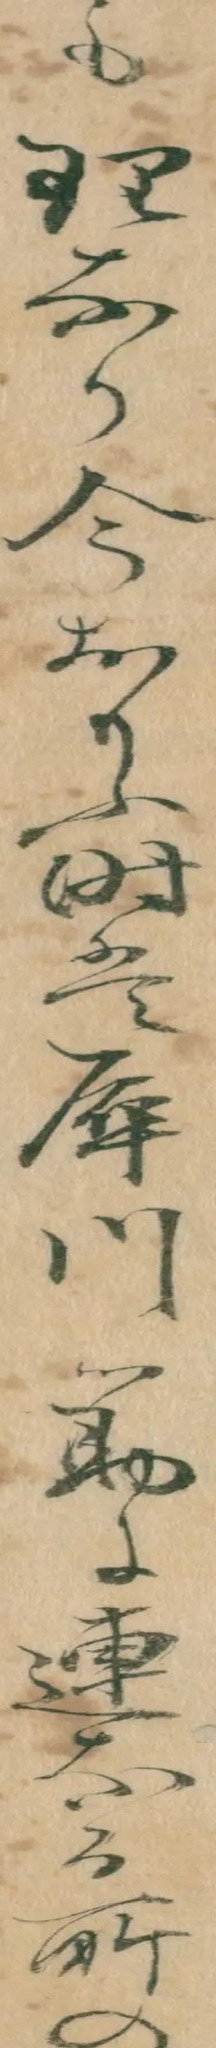も理なり今おもふ時は犀川筋に連なる所の
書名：俗語之種. [7]
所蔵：国立国会図書館 National Diet Library, JAPAN
